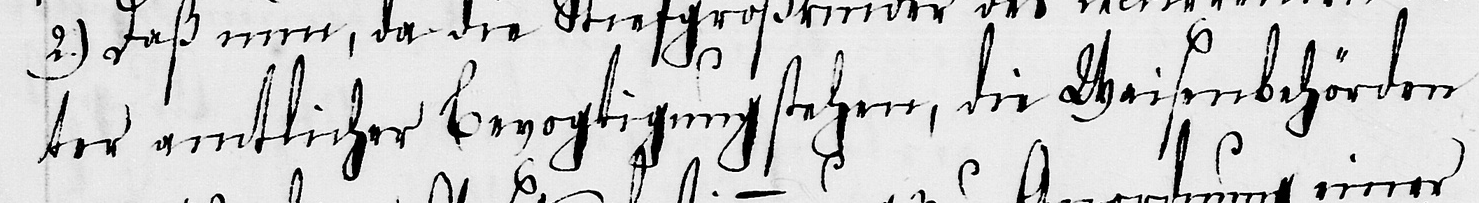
ter amtlicher Bevogtigung stehen, die Waisenbehörden
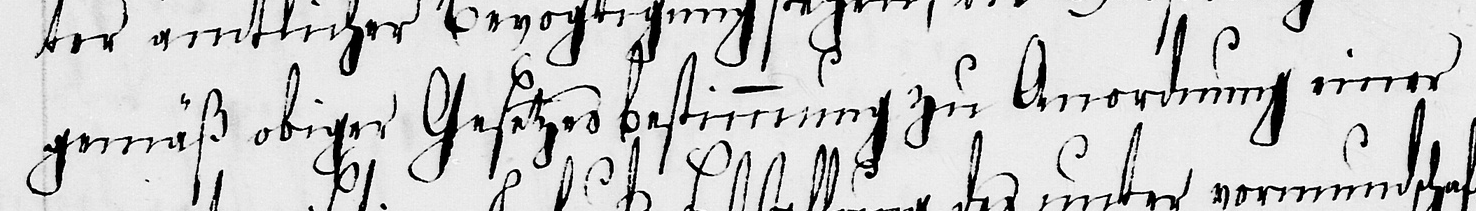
gemäß obiger Gesetzes Bestimmung zu Anordnung einer
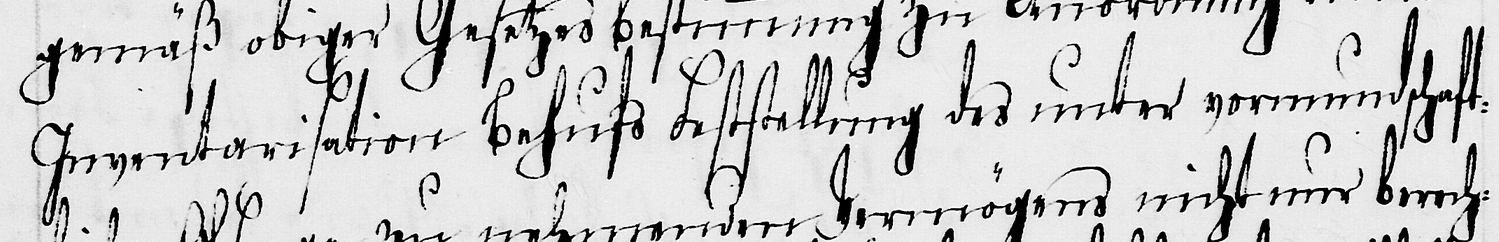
Inventarisation Behufs Feststellung des unter vormundschaf¬
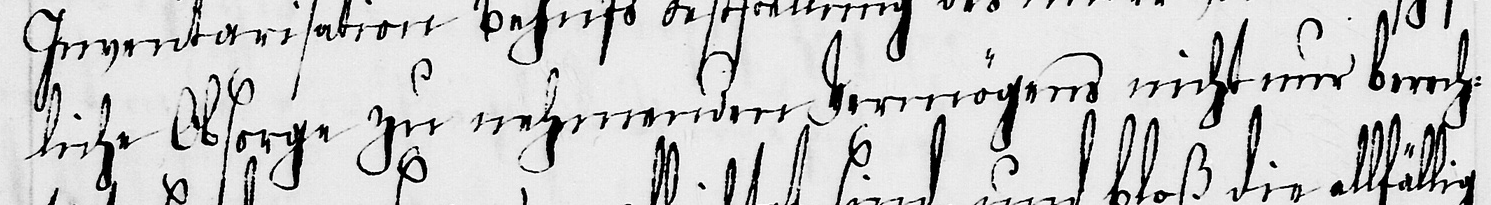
tliche Obsorge zu nehmenden Vermögens nicht nur berech¬
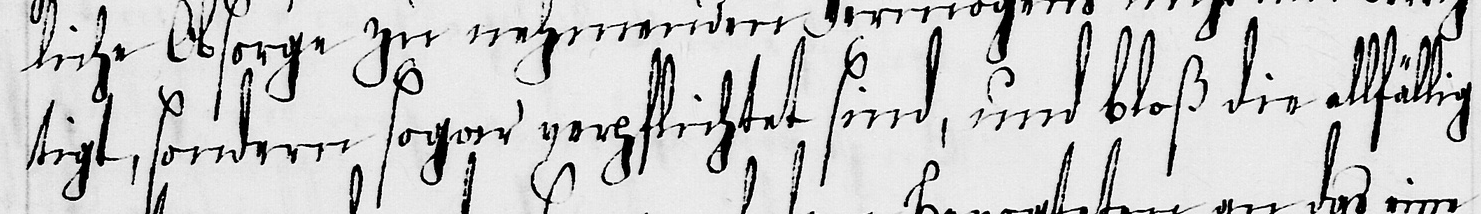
tigt, sondern sogar verpflichtet sind, und bloß die allfäl¬
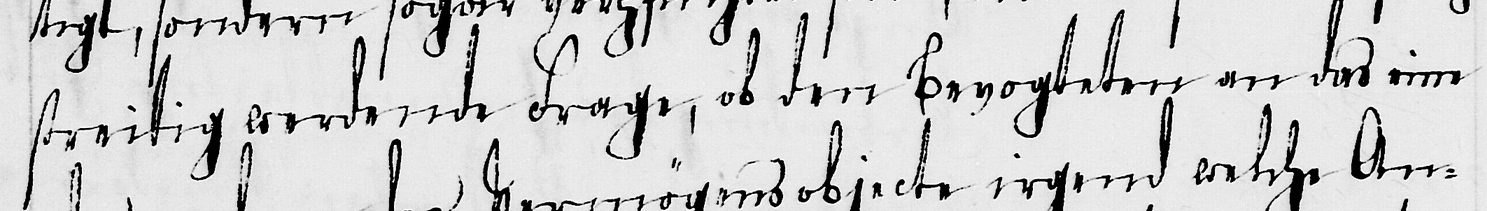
streitig werdende Frage, ob den Bevogteten an das eine
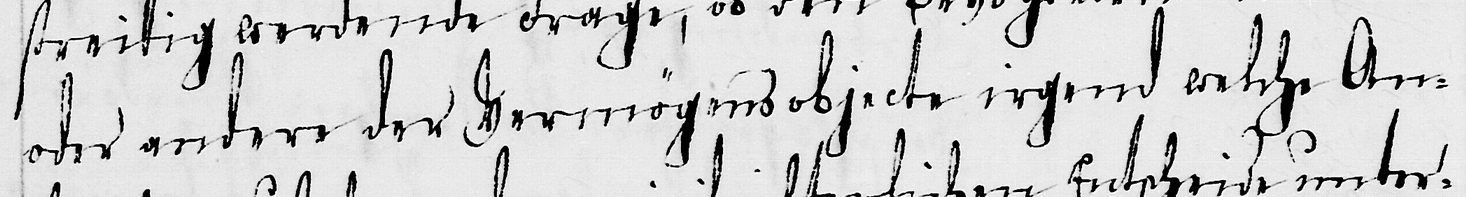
oder andere der Vermögensobjecte irgend welche An¬
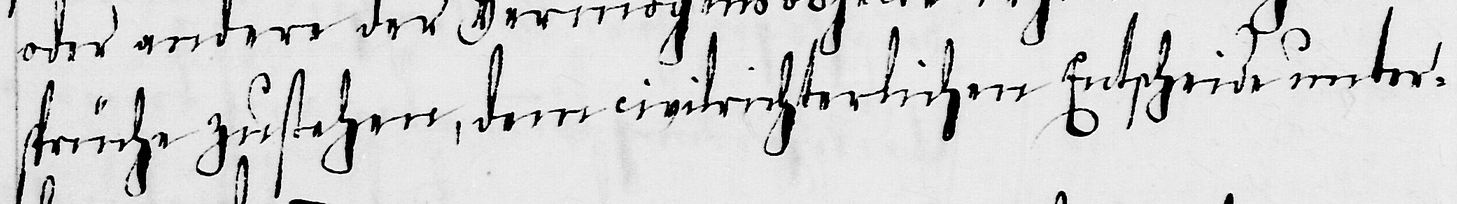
sprüche zustehen, dem civilrichterlichen Entscheide unter¬
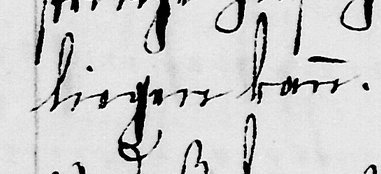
liegen kan¬
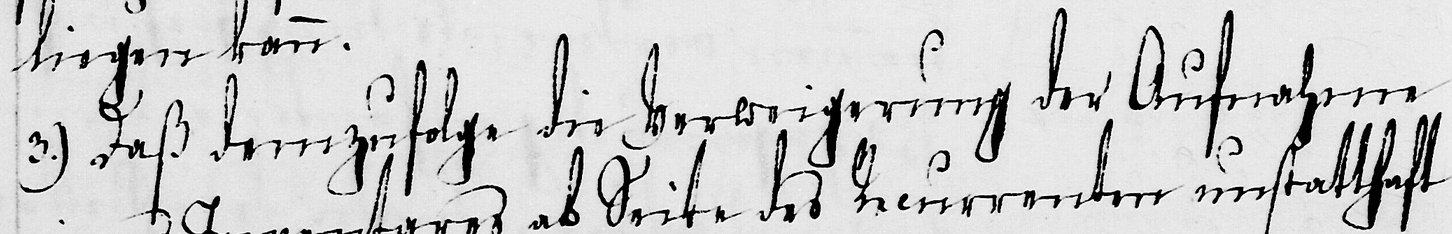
3.) Daß demzufolge die Verweigerung der Aufnahme
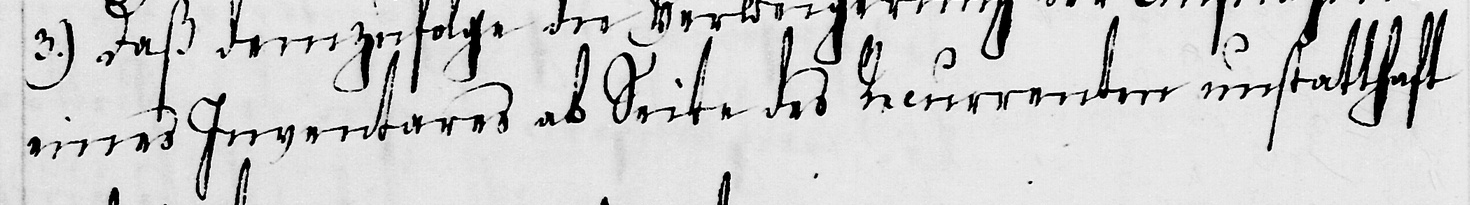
eines Inventares ab Seite des Recurrenten unstatthaft
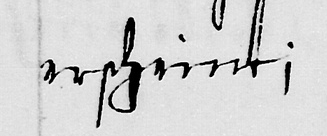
erscheint;
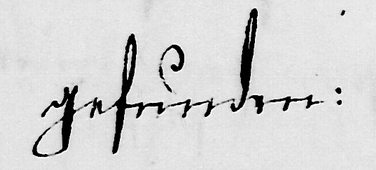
gefunden:
